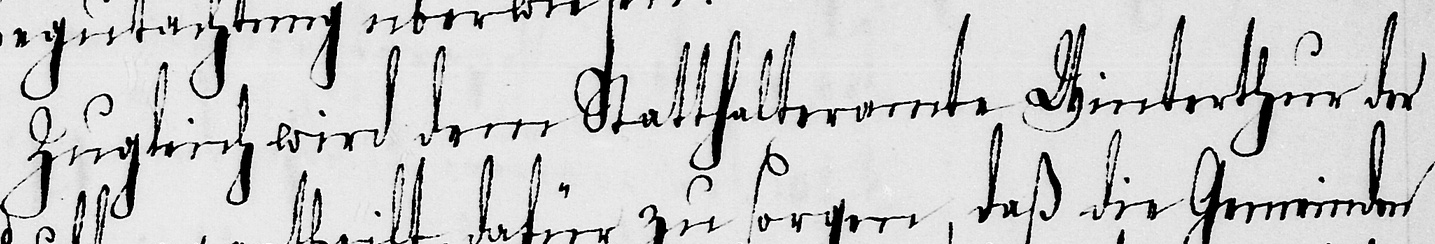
Zugleich wird dem Statthalteramte Winterthur der
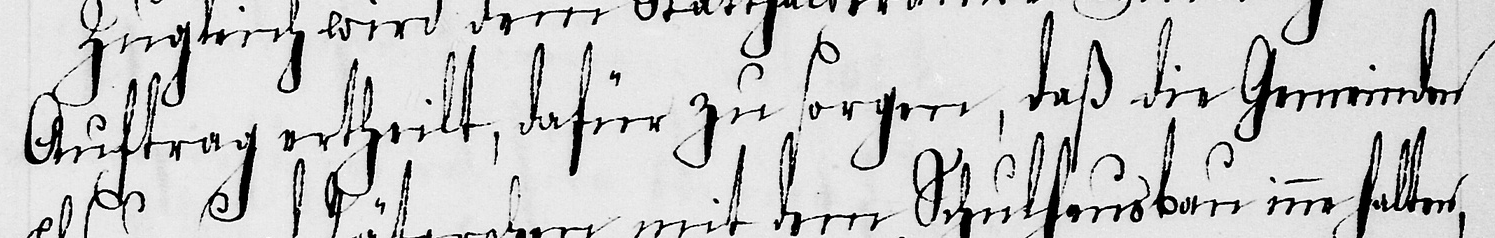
Auftrag ertheilt, dafür zu sorgen, daß die Gemeinden
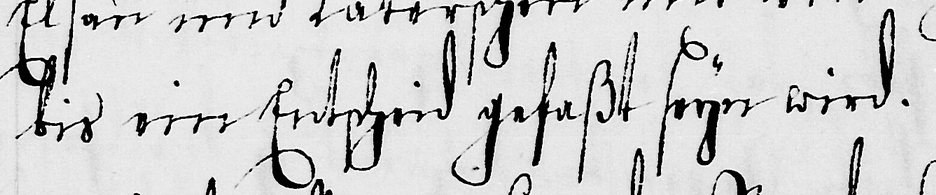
bis ein Entscheid gefaßt seyn wird.
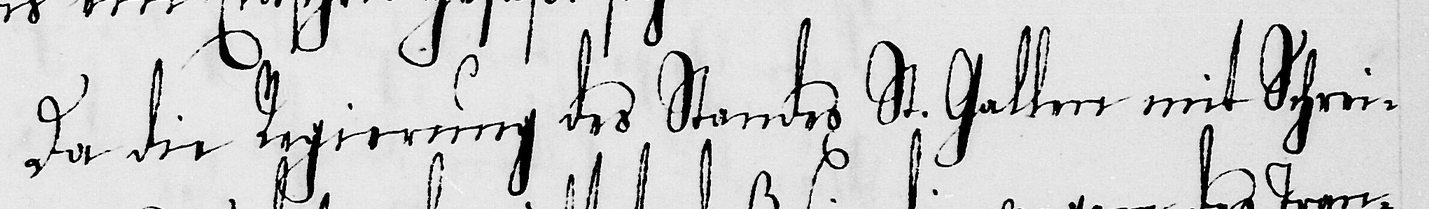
Da die Regierung des Standes St. Gallen mit Schrei¬
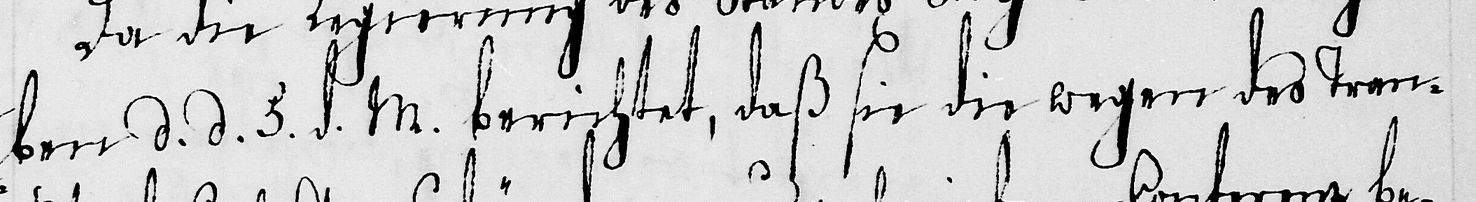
ben d. d. 5. d. M. berichtet, daß sie die wegen des Trans¬
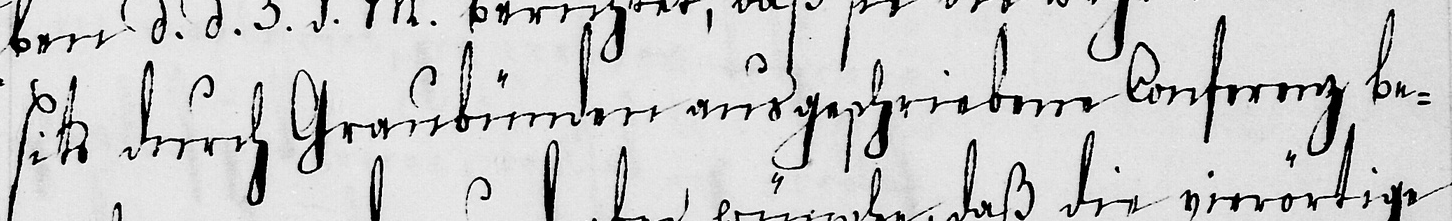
its durch Graubünden ausgeschriebene Conferenz be¬
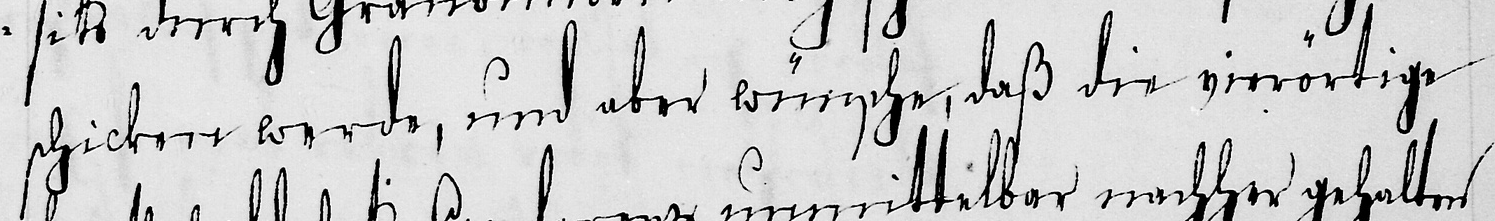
schicken werde, und aber wünsche, daß die vierörtige
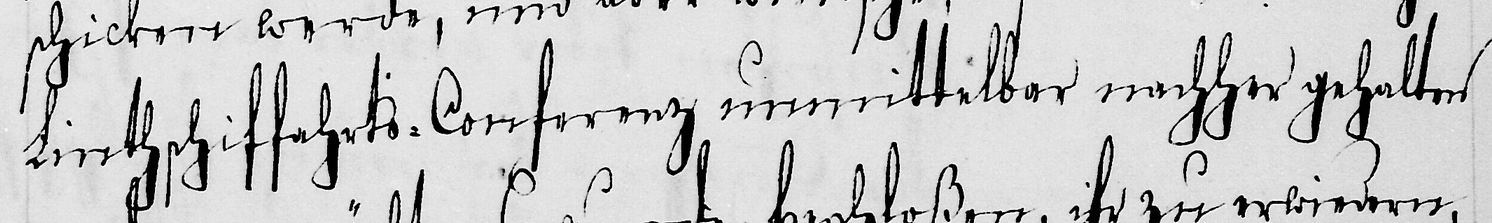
Linthschiffahrts-Conferenz unmittelbar nachher gehalten
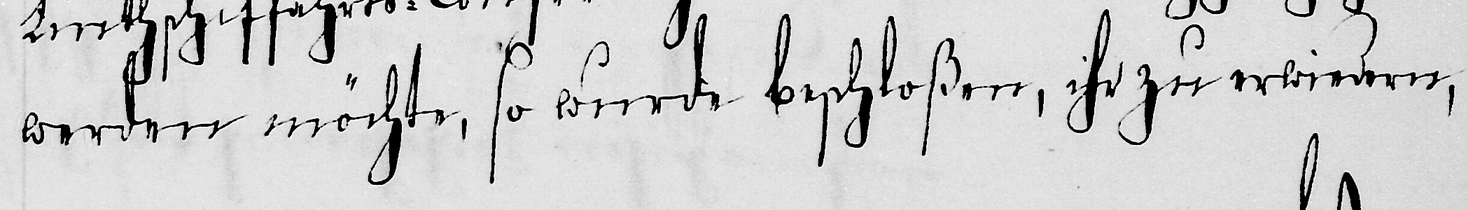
werden möchte, so wurde beschloßen, ihr zu erwiedern,
